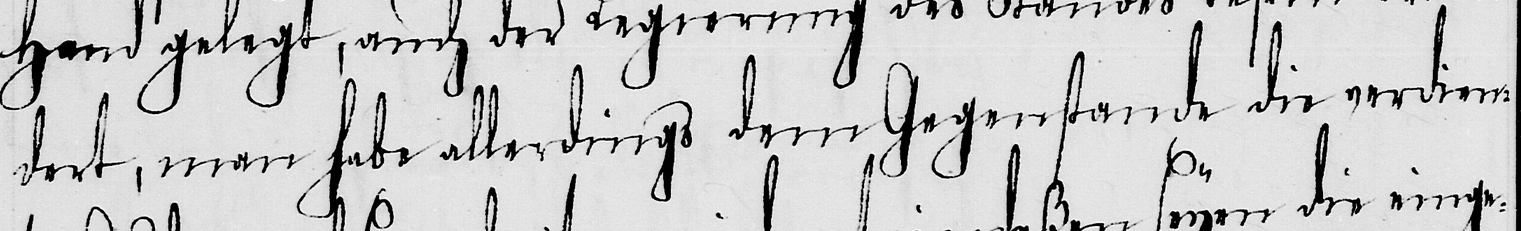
dert, man habe allerdings dem Gegenstande die verdien¬
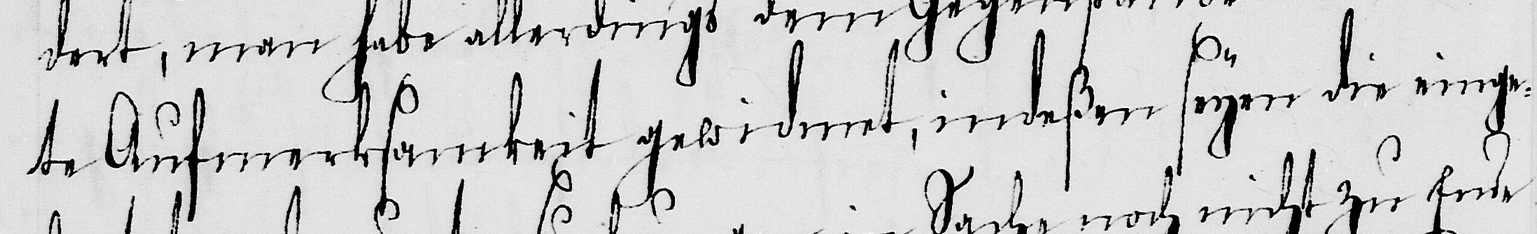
te Aufmerksamkeit gewidmet, indeßen seyen die eing¬
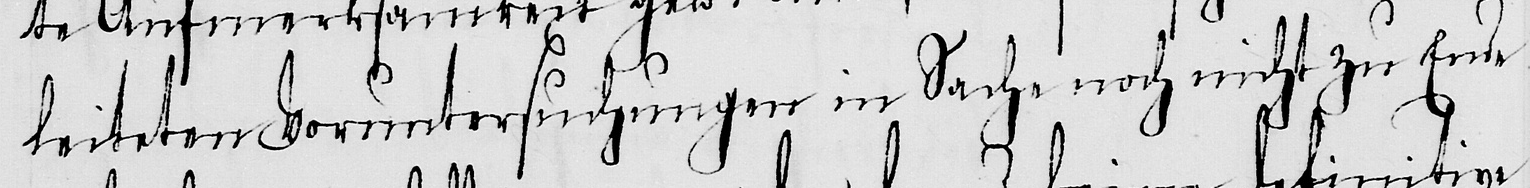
eleiteten Voruntersuchungen in Sache noch nicht zu Ende
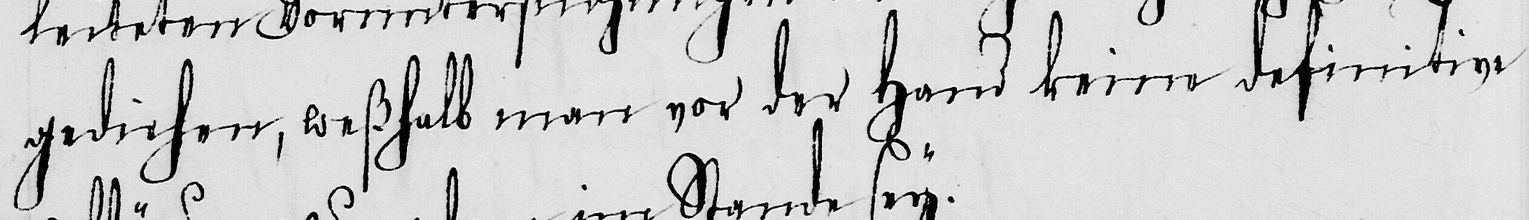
gediehen, weßhalb man vor der Hand keine definitive
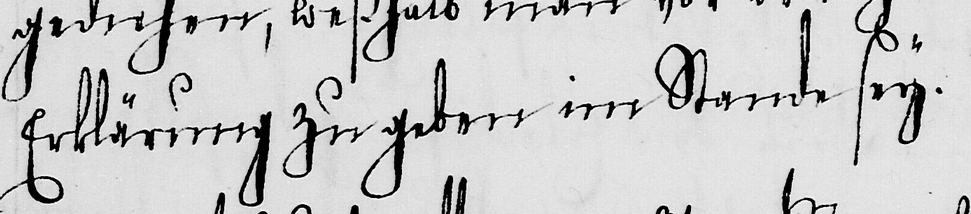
Erklärung zu geben im Stande sey.
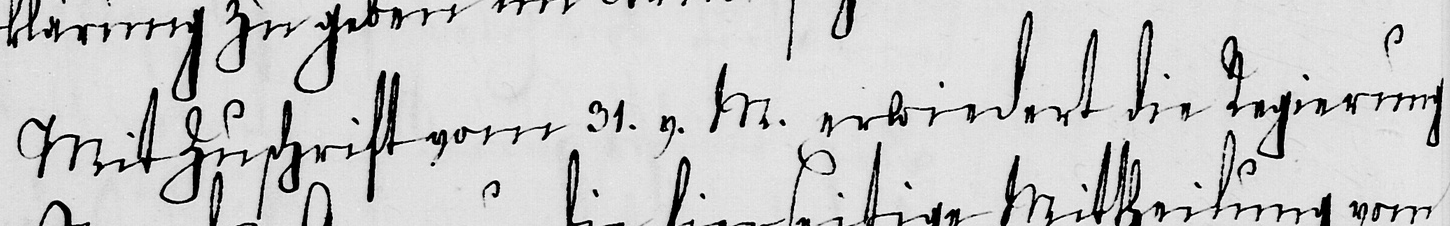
Mit Zuschrift vom 31. v. M. erwiedert die Regierung
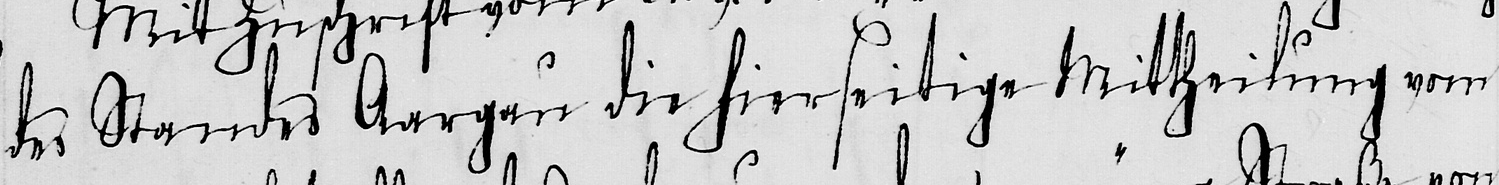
des Standes Aargau die hierseitige Mittheilung vom
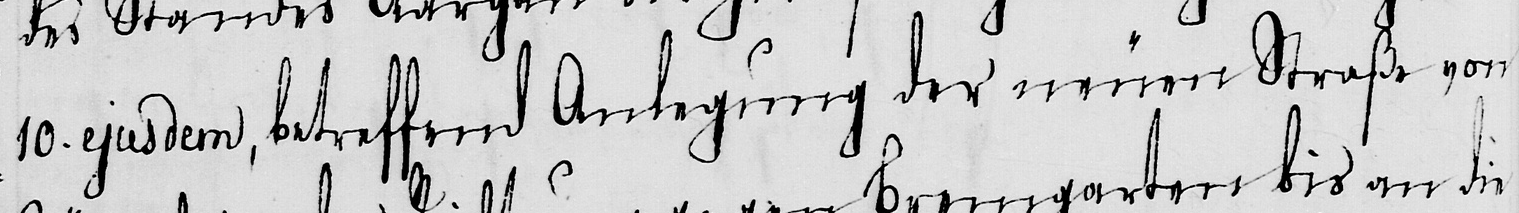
10. ejusdem, betreffend Anlegung der neuen Straße von
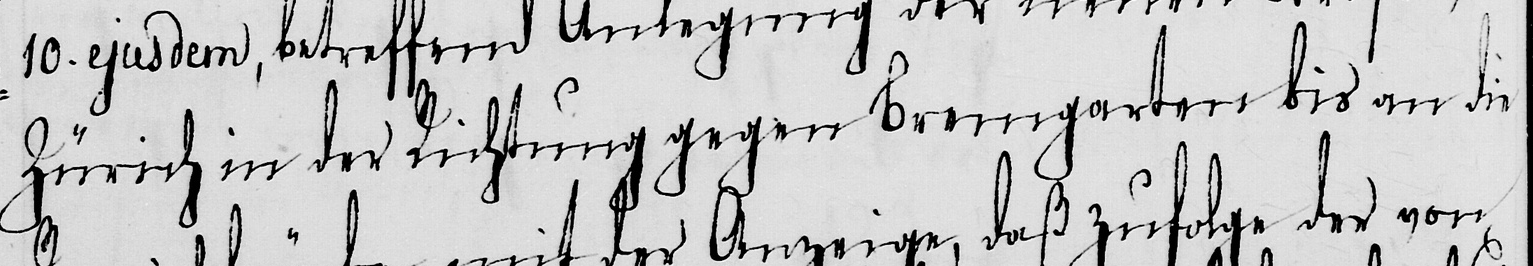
Zürich in der Richtung gegen Bremgarten bis an die
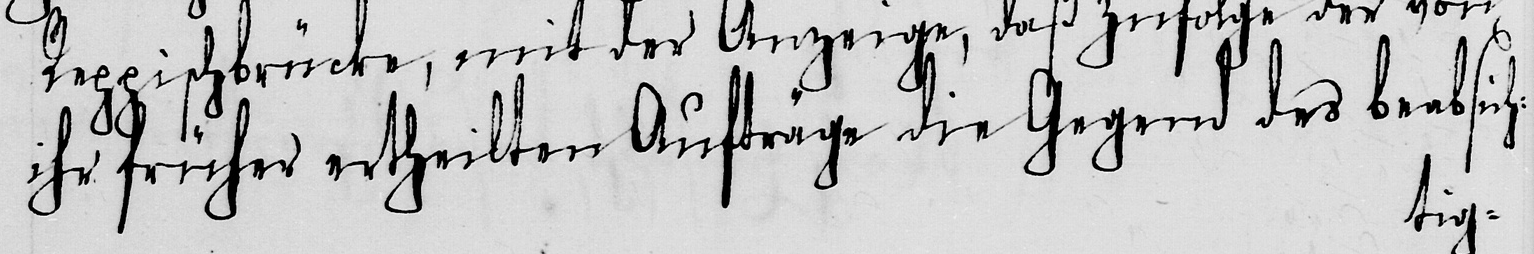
ihr früher ertheilten Aufträge die Gegend des beabsic¬
